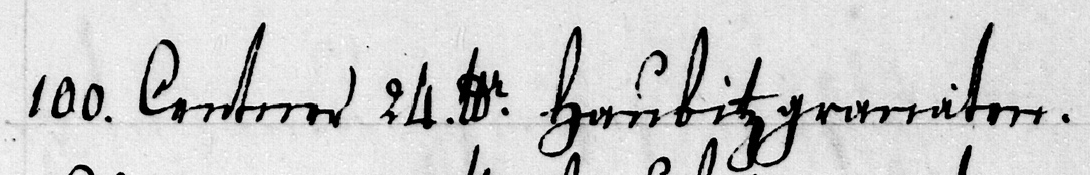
100. Centner 24. lbr. Haubitzgranaten.
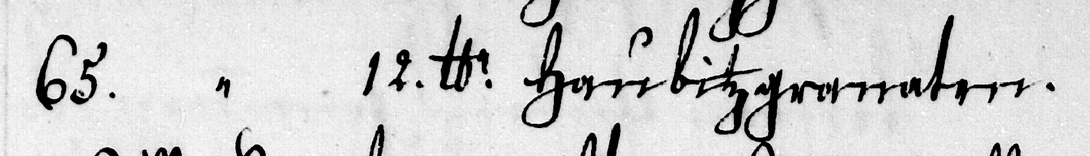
65. “ 12. lbr. Haubitzgranaten.
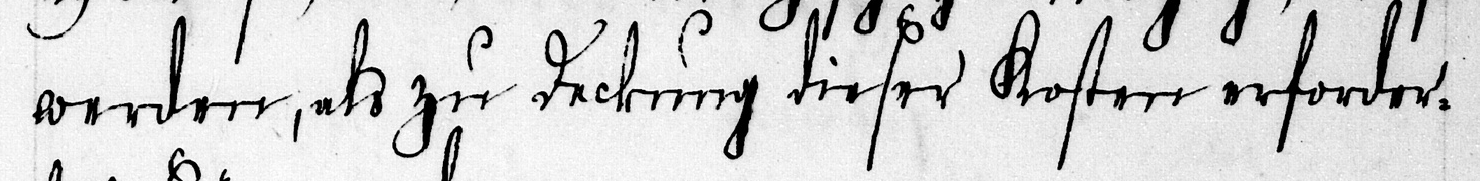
werden, als zu Deckung dieser Kosten erforder¬
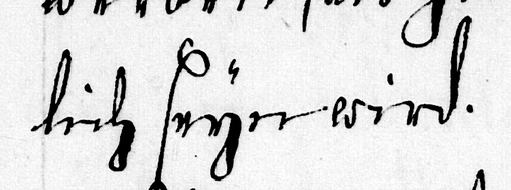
lich seyn wird.
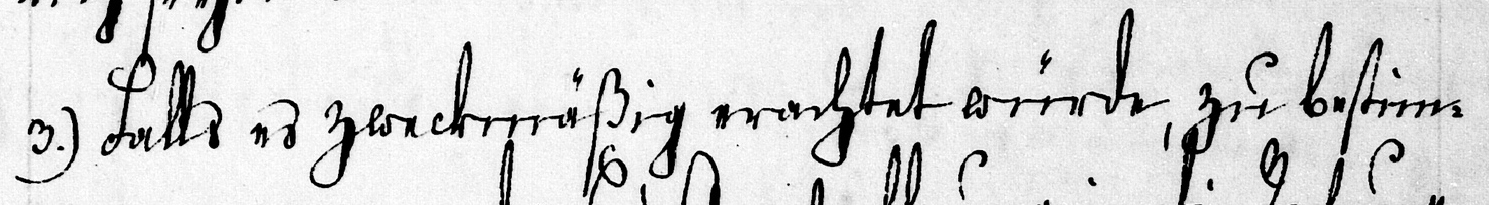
3.) Falls es zweckmäßig erachtet würde, zu bestim¬
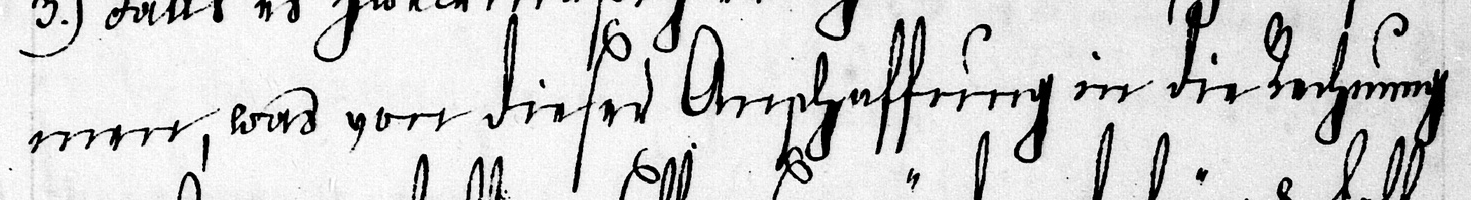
men, was von dieser Anschaffung in die Rechnung
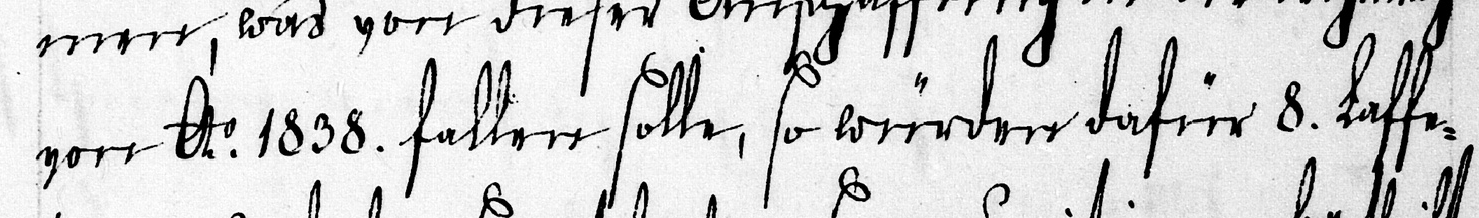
von Ao. 1838. fallen solle, so würden dafür 8. Laff¬
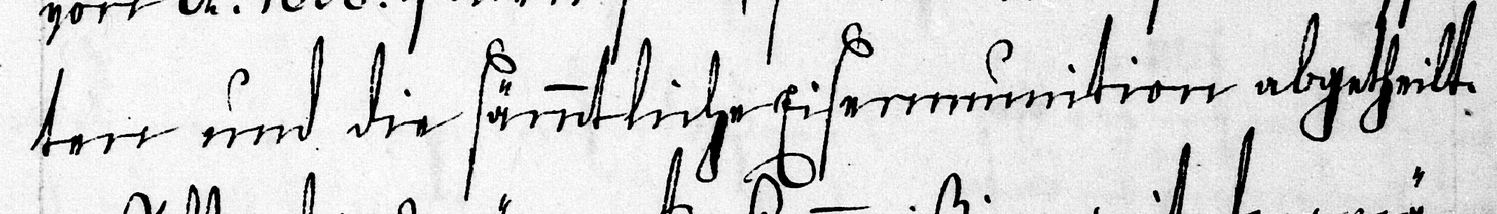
eten und die sämmtliche Eisenmunition abgetheilt.
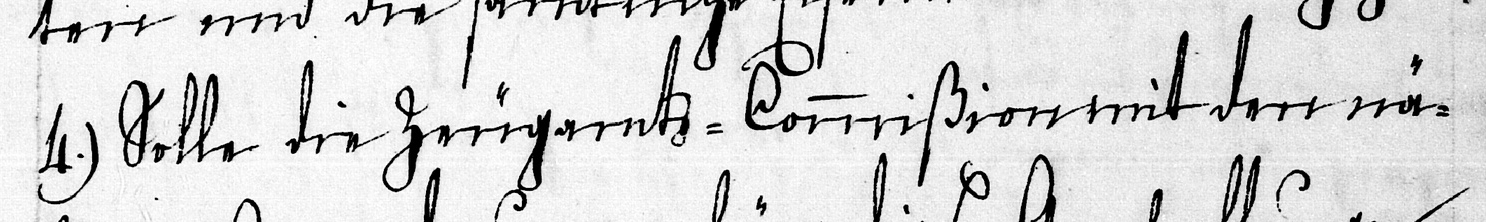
4.) Solle die Zeugamts-Commißion mit den nä¬
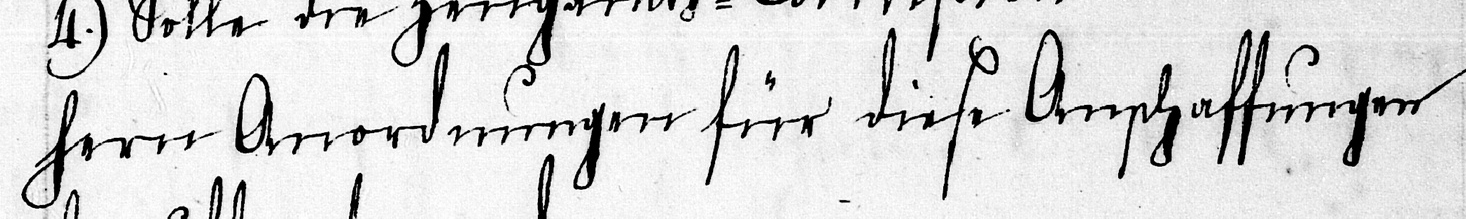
hern Anordnungen für diese Anschaffungen
